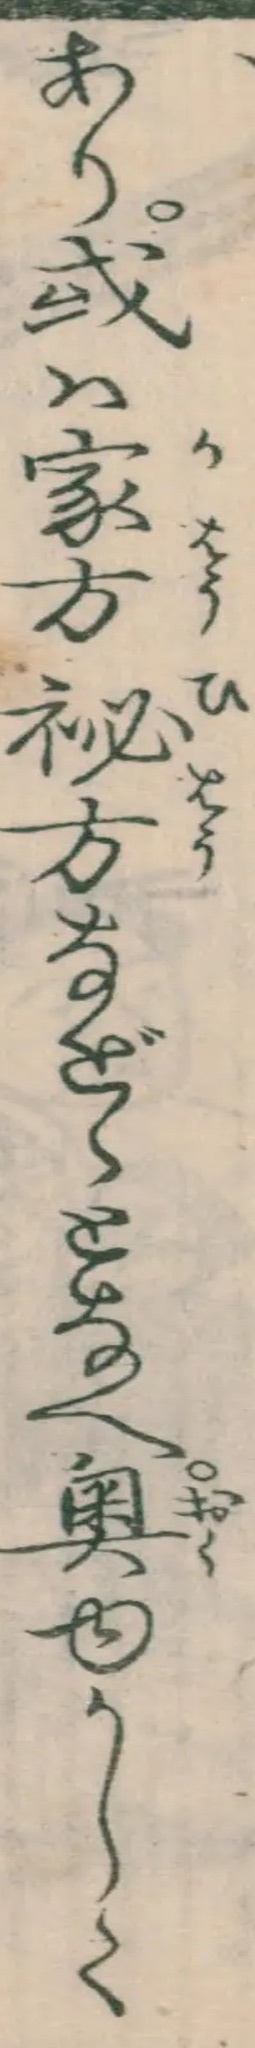あり。或は家方秘方などゝとなへ。奥ゆかしく
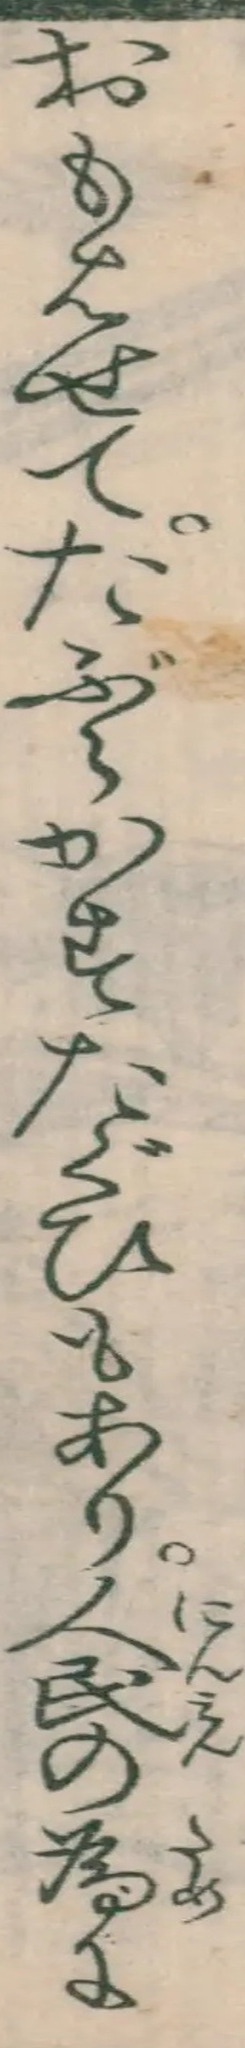おもはせて。たぶらかすたぐひもあり。人民の為に
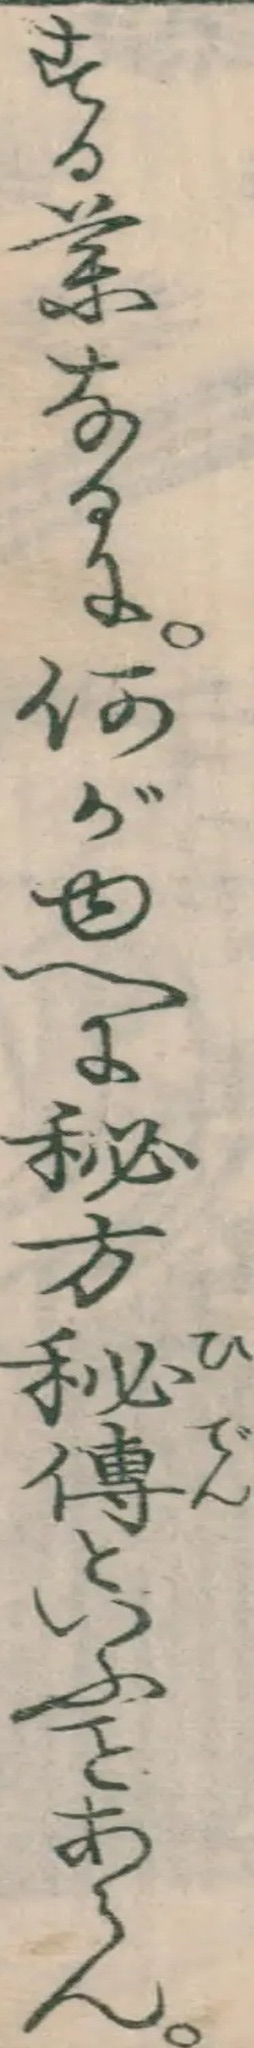する藥なるに。何がゆへに秘方秘傅といふことあらん。
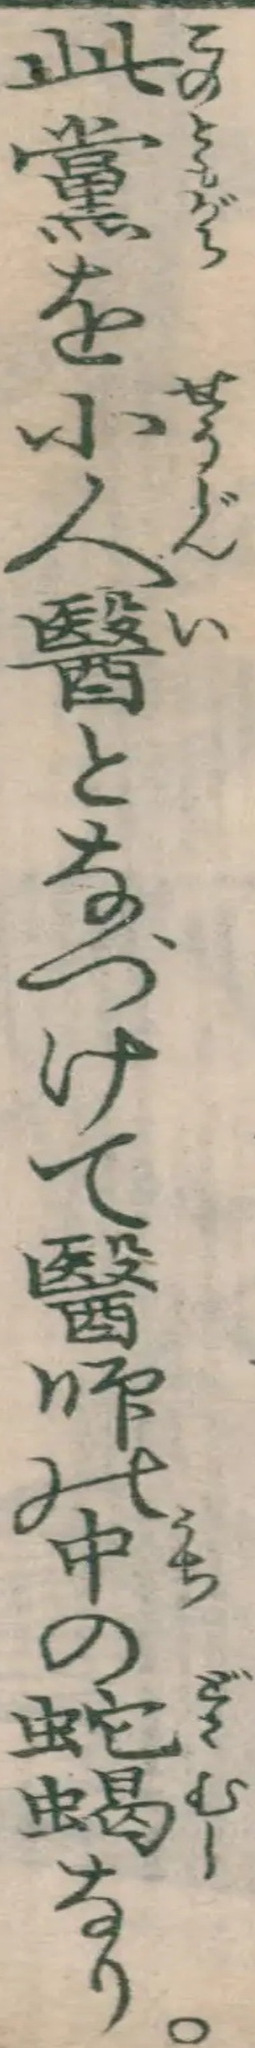此黨を小人醫となづけて醫師の中の蛇蝎なり。
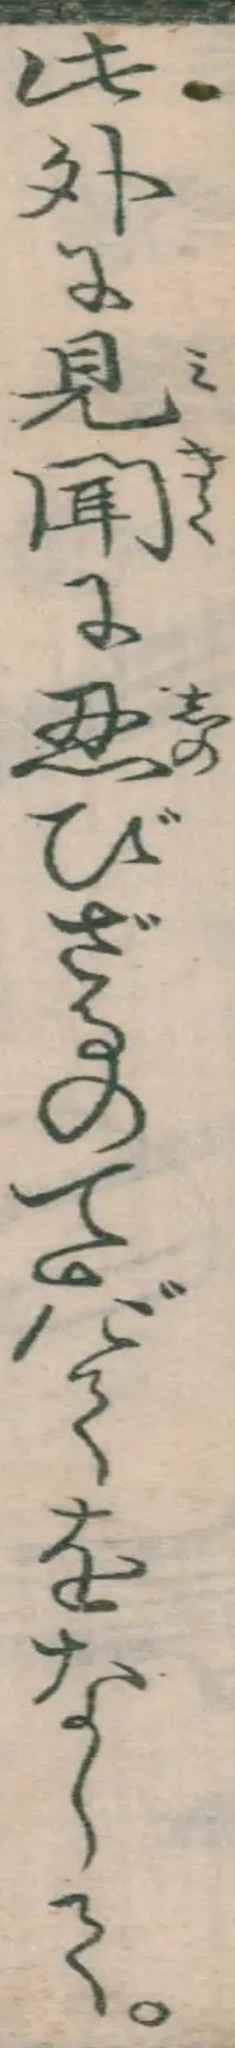此外に見聞に忍びざるのてだてをなして。
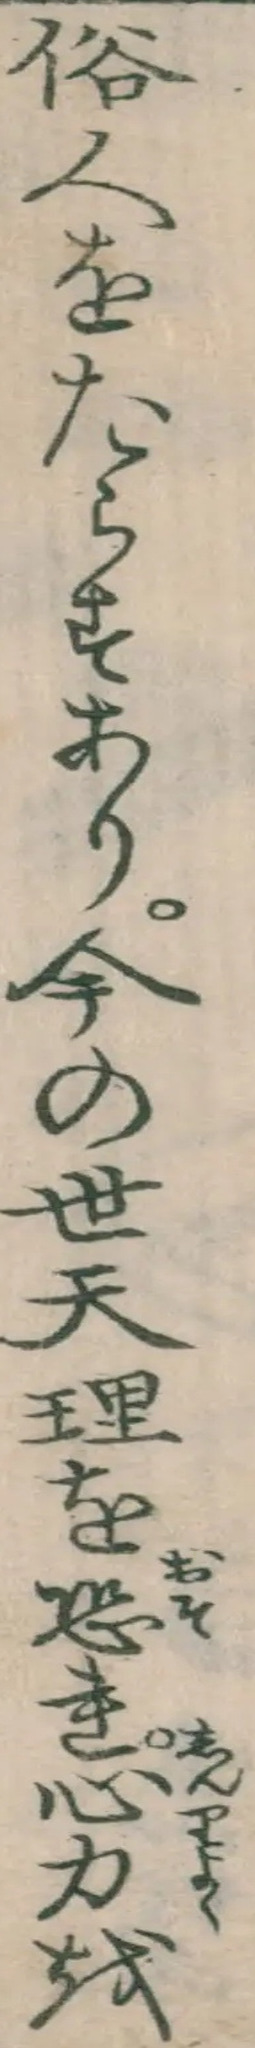俗人をたらすあり。今の世天理を恐れ。心力を

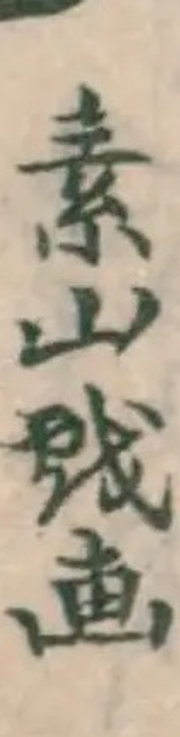素山戯画

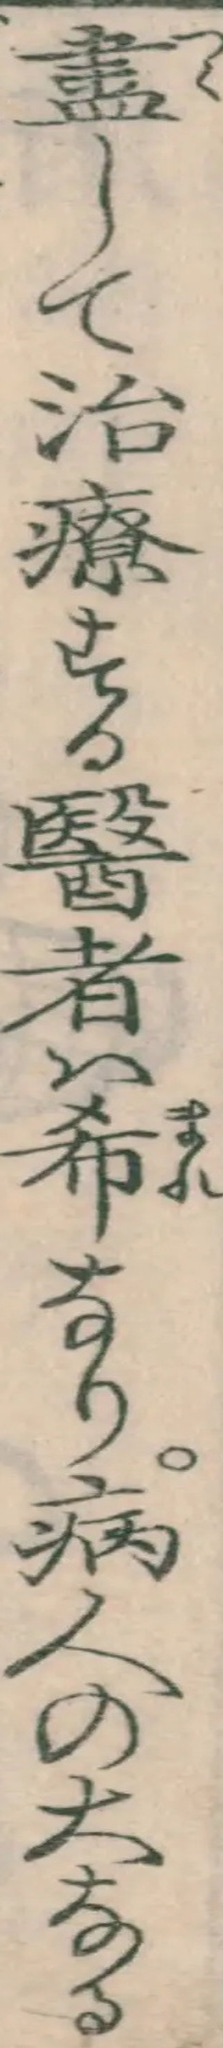盡して治療する醫者は希なり。病人の大なる
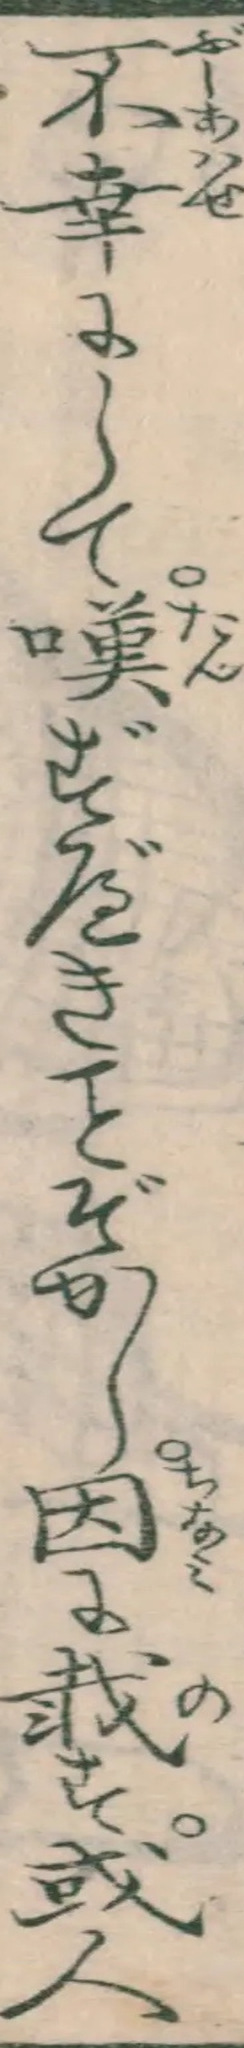不幸にして。嘆ずべきことそかし。因に載す。或人
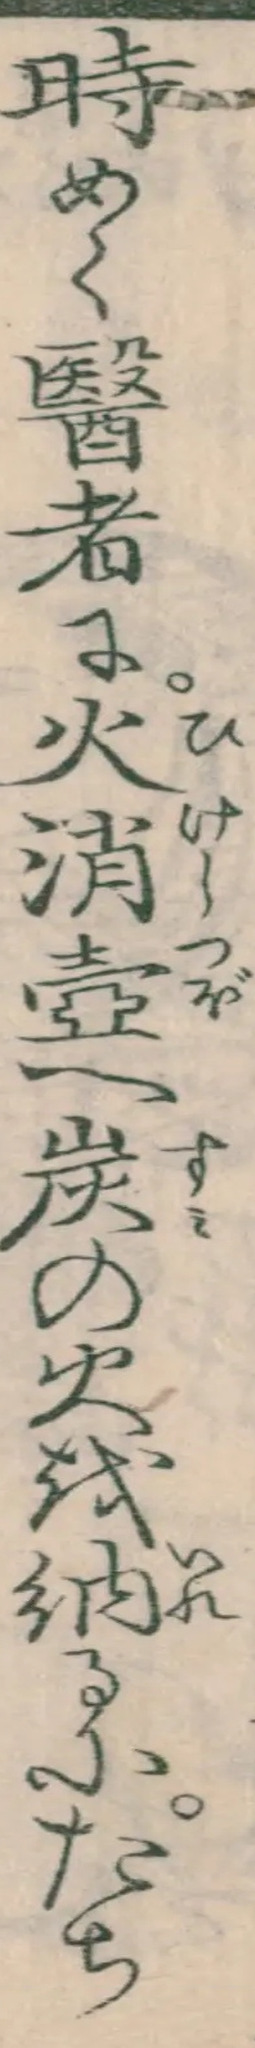時めく醫者に。火消壷に火を納るに。たち
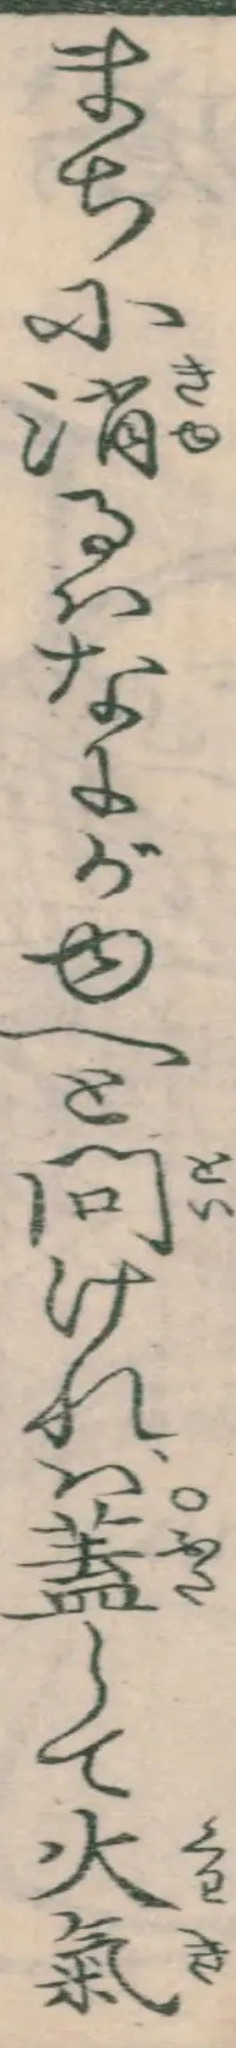まちに消るはなにがゆへと問けれは。蓋して火氣
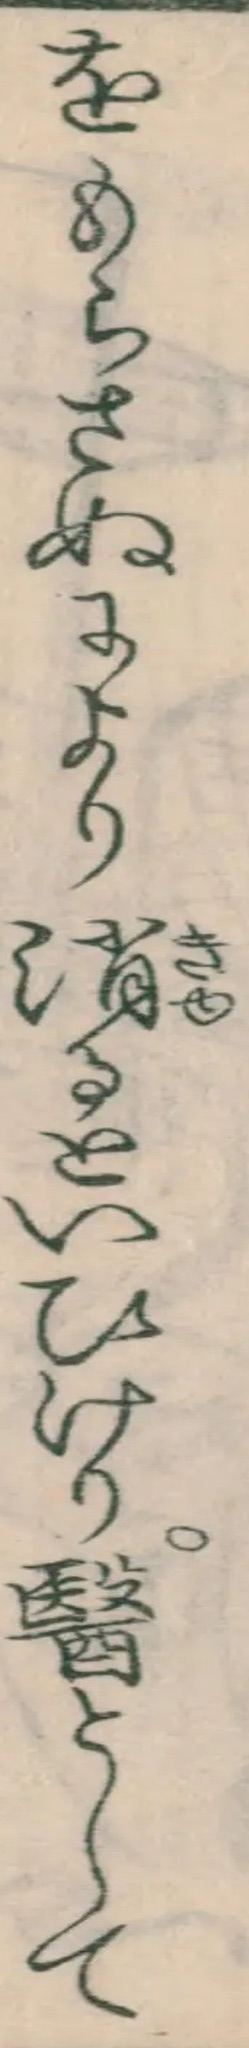をもらさぬにより消るといひけり。醫として
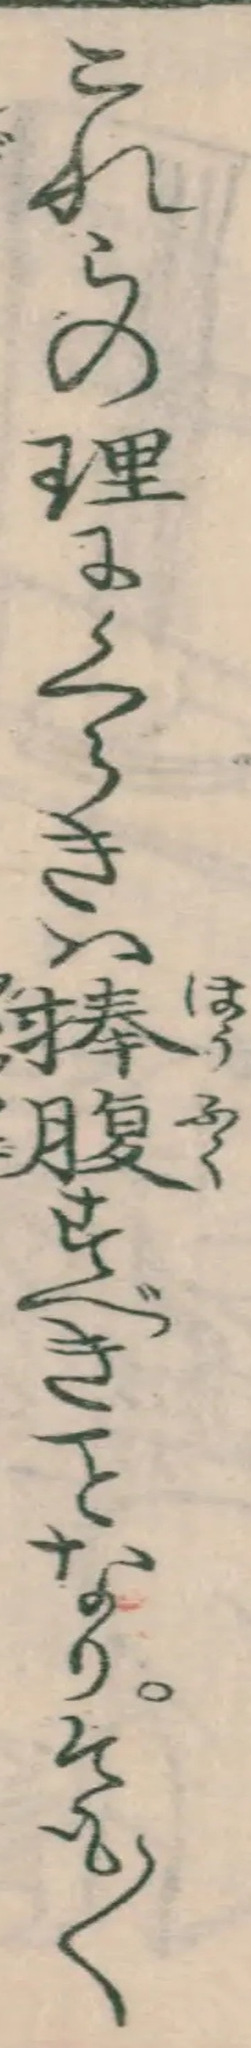これらの理にくらきは捧腹すべきことなり。そも〳〵
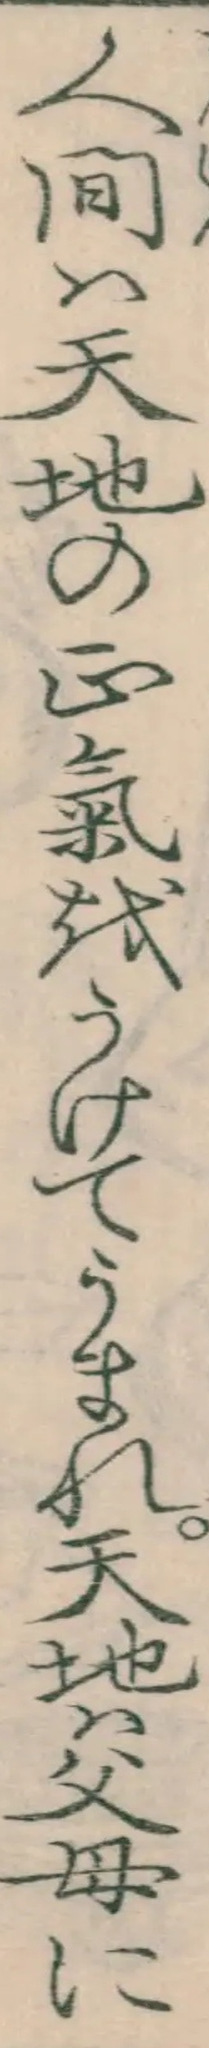人間は天地の正氣をうけてうまれ。天地は父母に
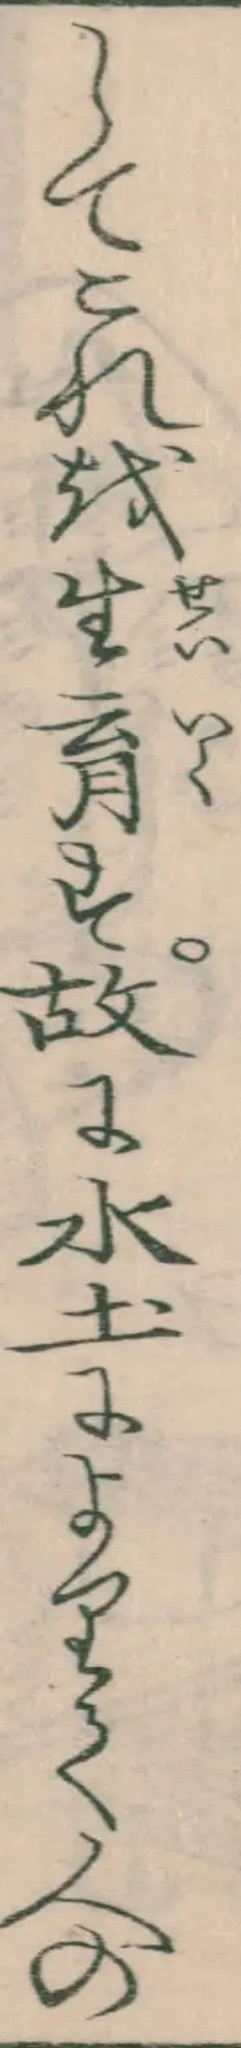してこれを生育す。故に水土によりて人の
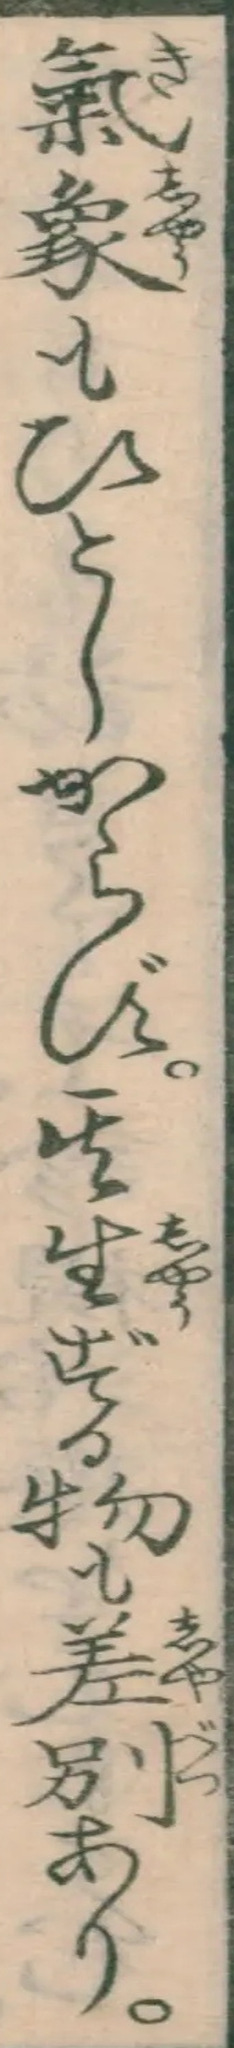氣象もひとしからず。其生ずる物も差別あり。
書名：瘡家示訓
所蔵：国立国会図書館 National Diet Library, JAPAN
